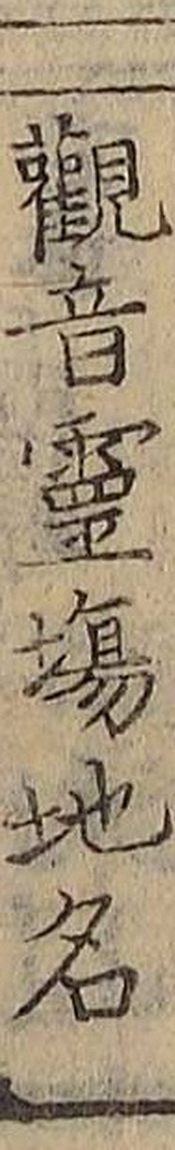観音霊場地名
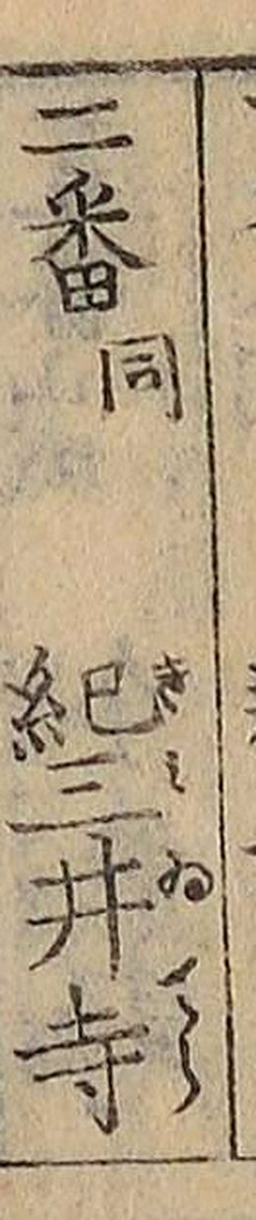二番同三井寺

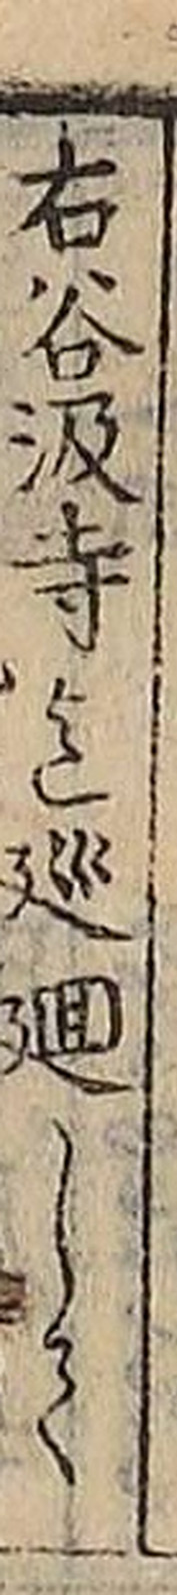右谷汲寺迄巡廻して
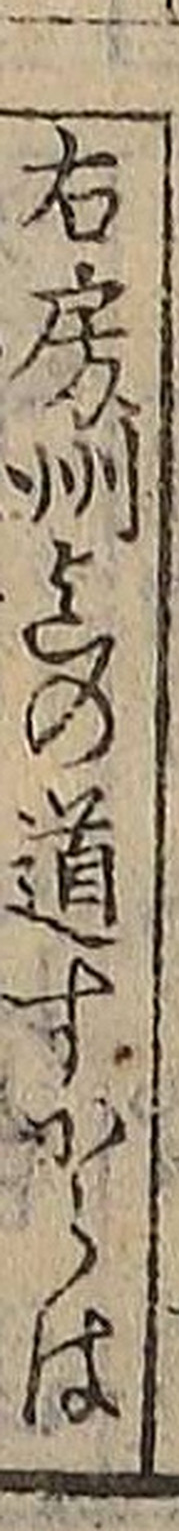右房州迄の道すからは
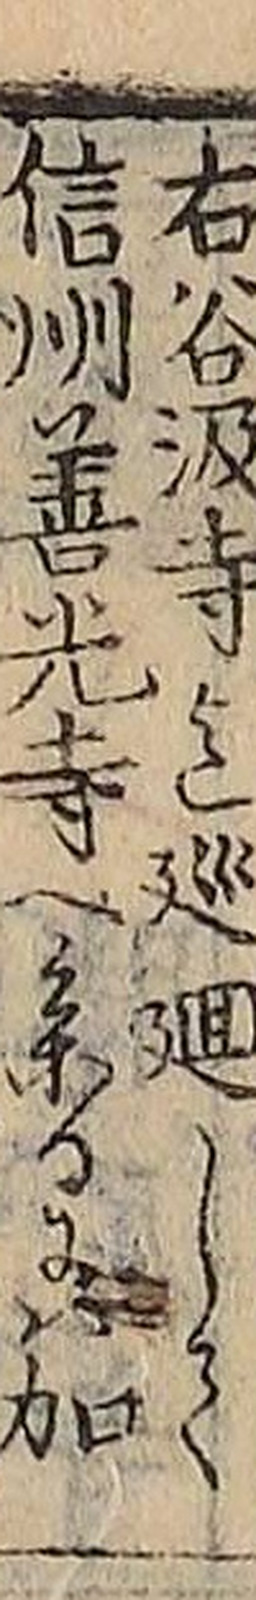信州善光寺へ参るには加
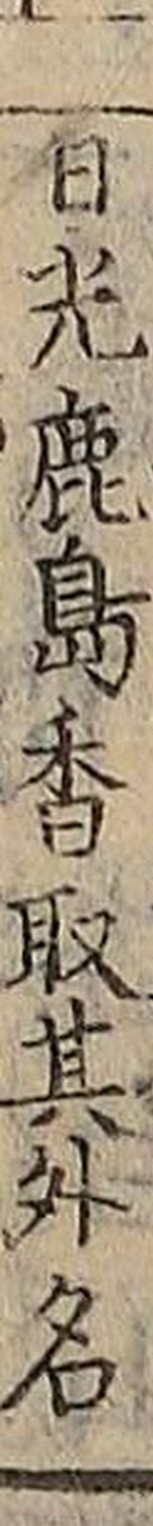日光鹿島香取其外名
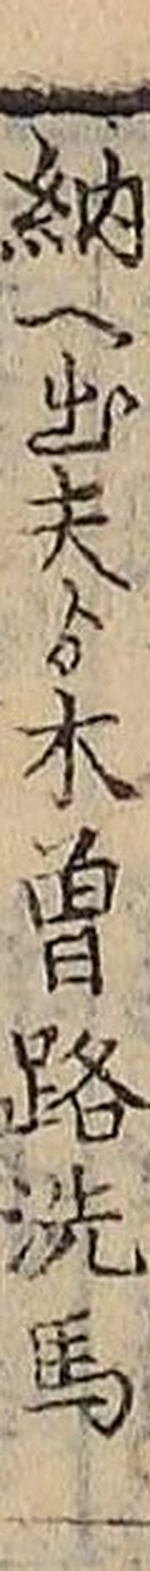納へ出夫ゟ木曽路洗馬
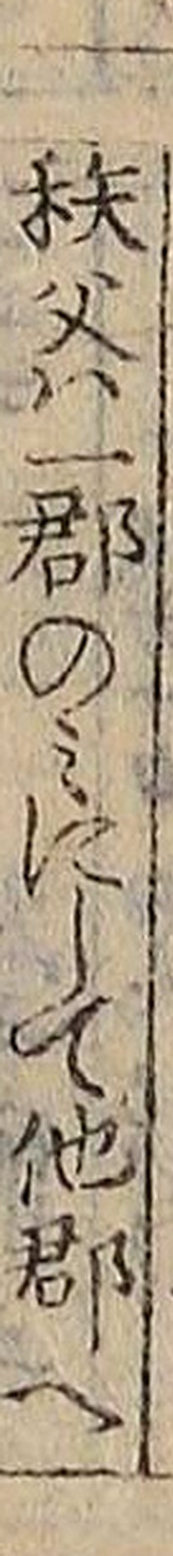秩父は一郡のみにして他郡へ
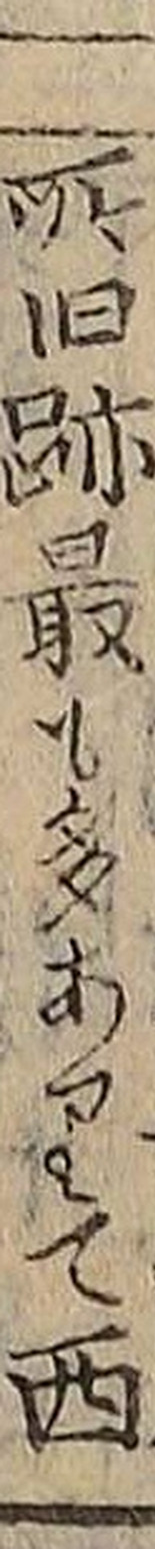所旧跡最も多ありて西
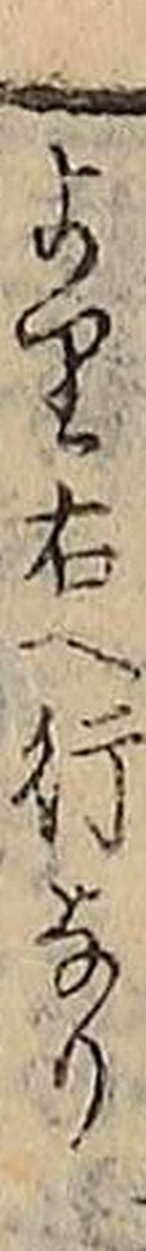より右へ行なり
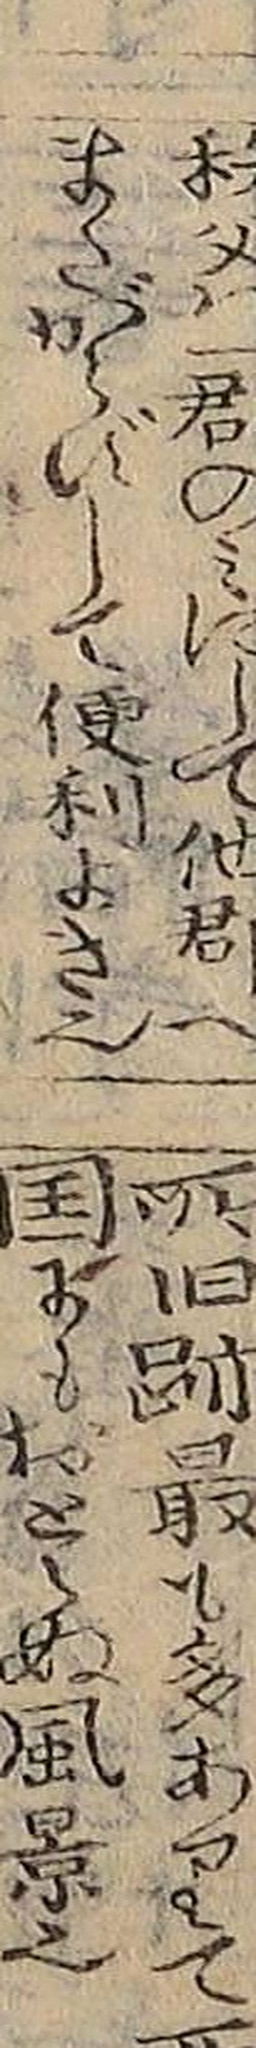またがらずして便利よき也
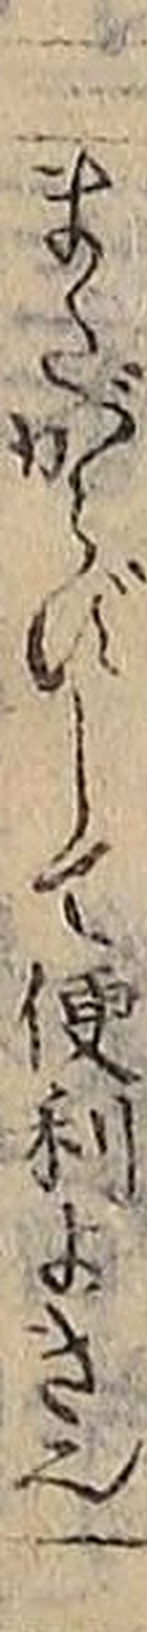またがらずして便利よき也
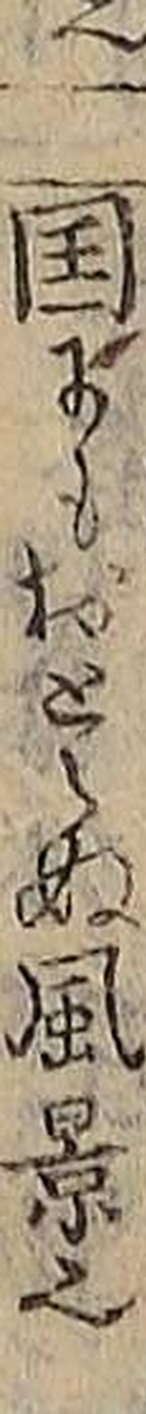国にもおとらぬ風景也
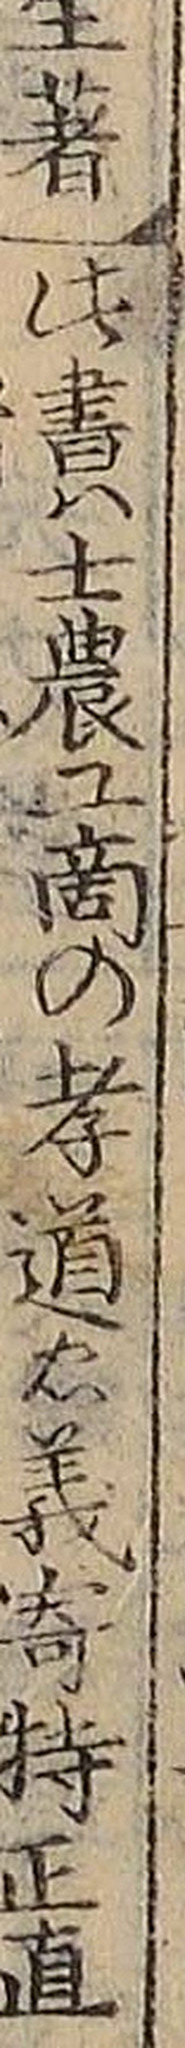此書は士農工商の孝道忠義寄特正直
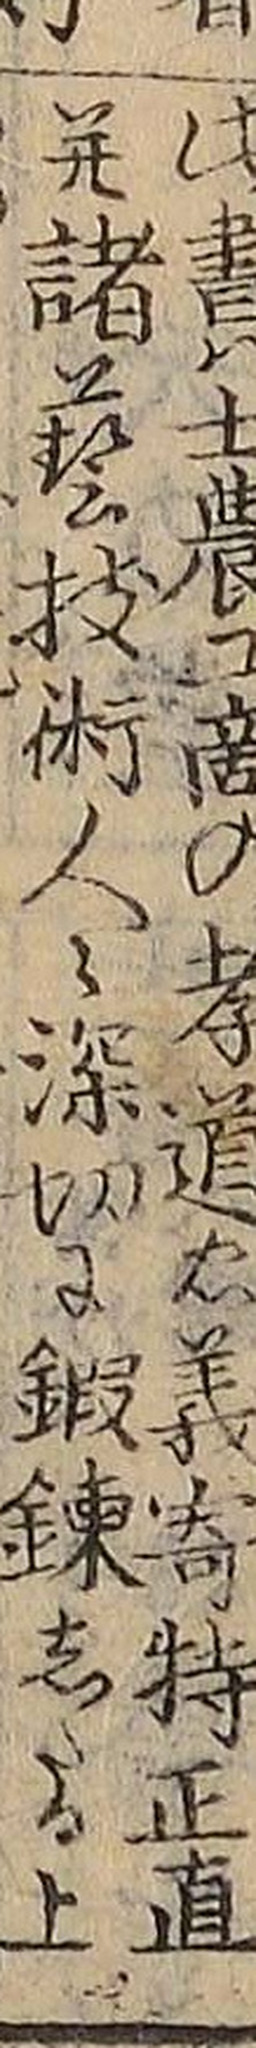并諸芸技術人々深切に鍛錬したる上
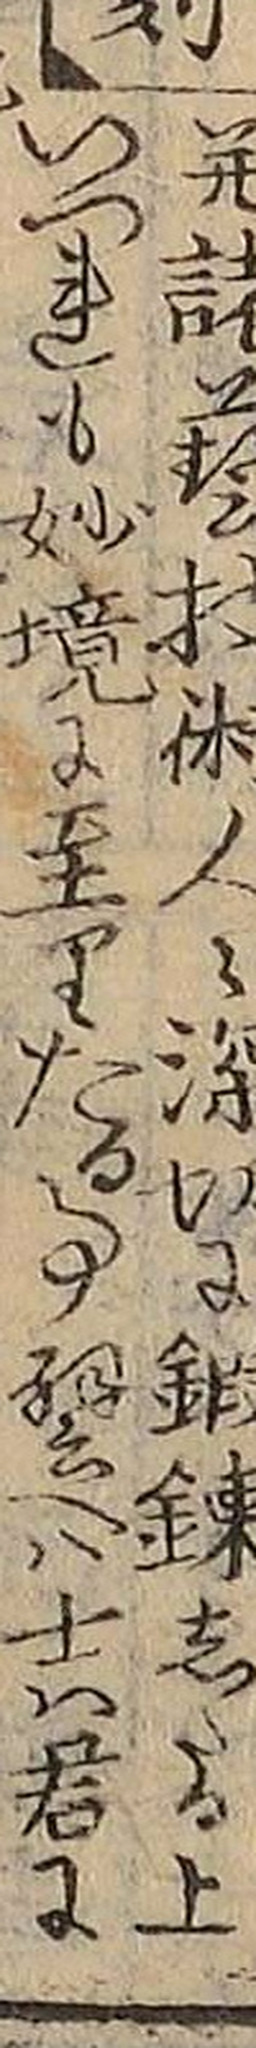いつれも妙境に至りたる事譬へは士は君に
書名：旅行用心集
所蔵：神戸大学附属図書館 国文学研究資料館
